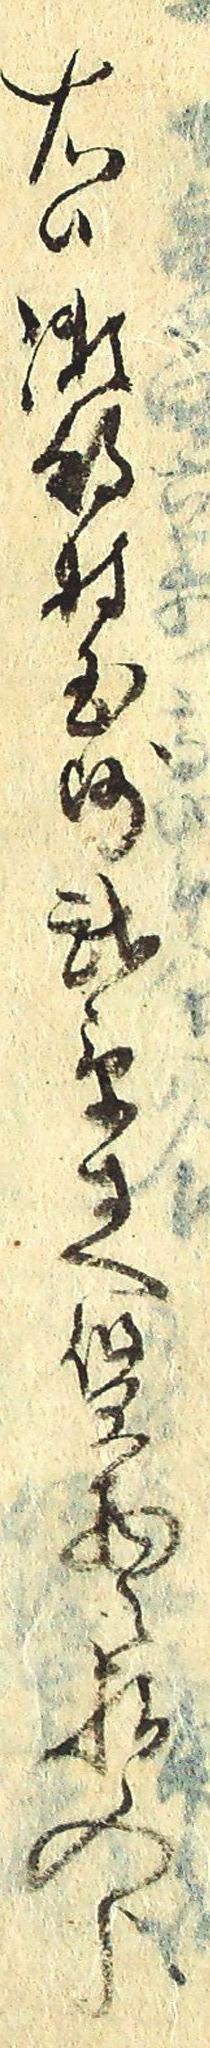右は瀬部村玉師武兵衛方へ質物に指入申
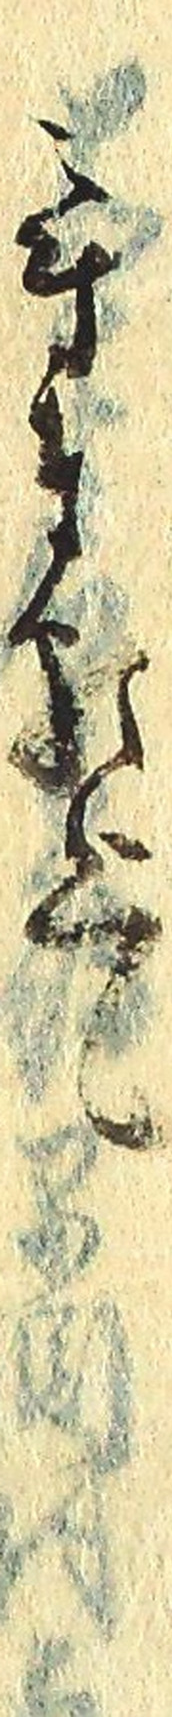に付奉願上候
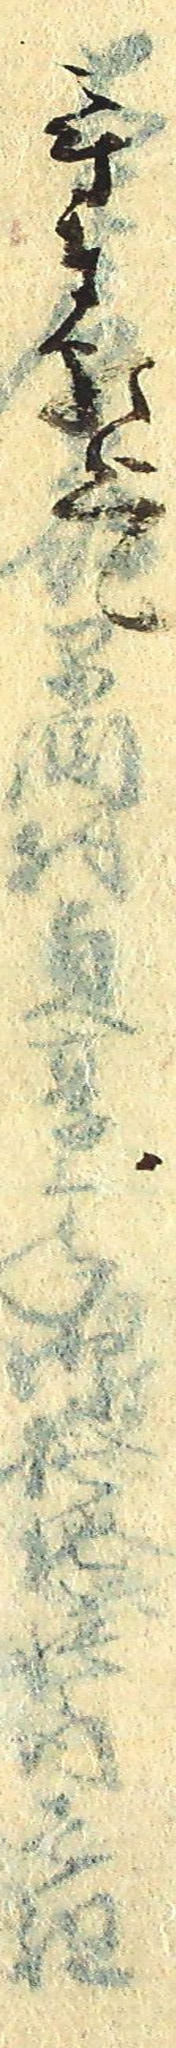に付奉願上候
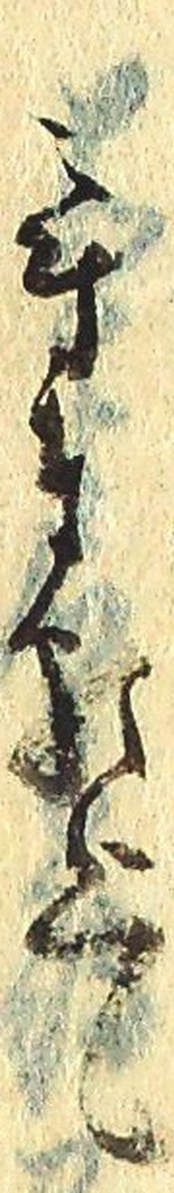に付奉願上候
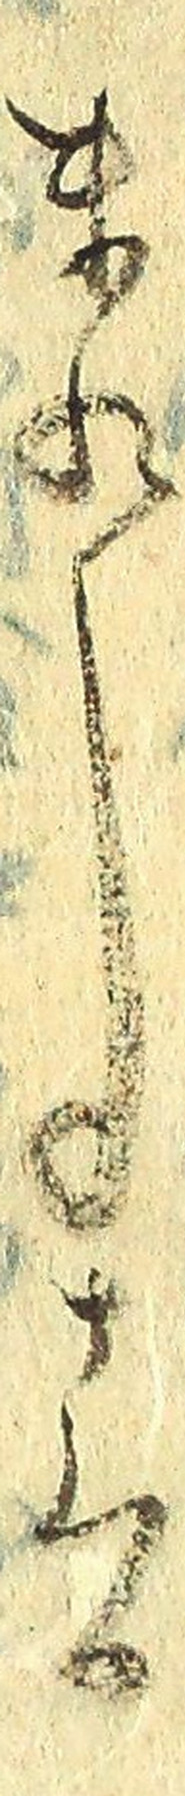未九月十三日

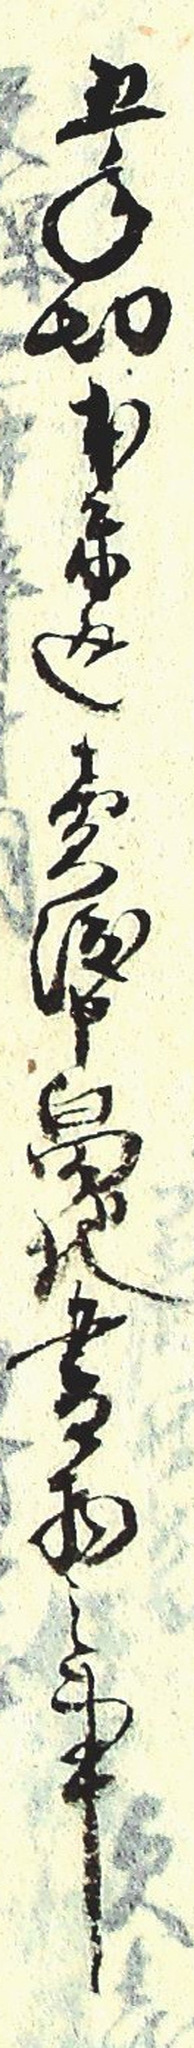五年切本米返売渡申畠地書物之事
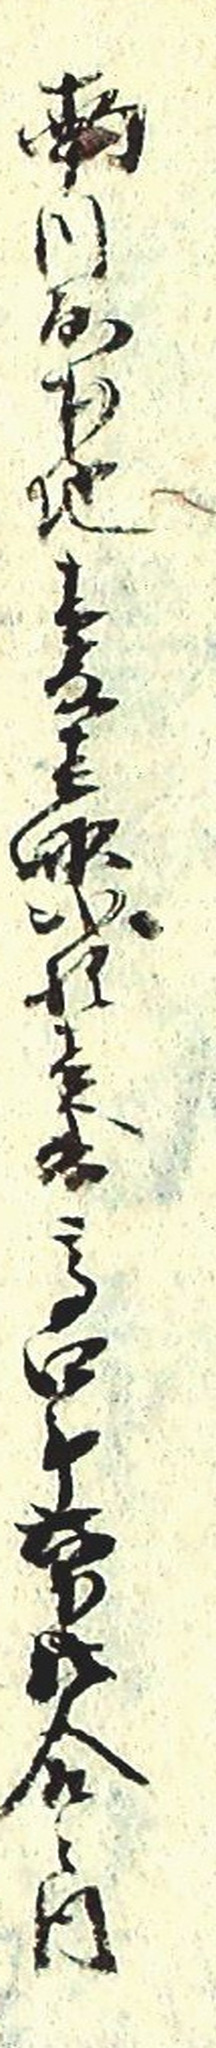南川原本地壱反壱畝弐拾壱歩高四斗六升八合之内
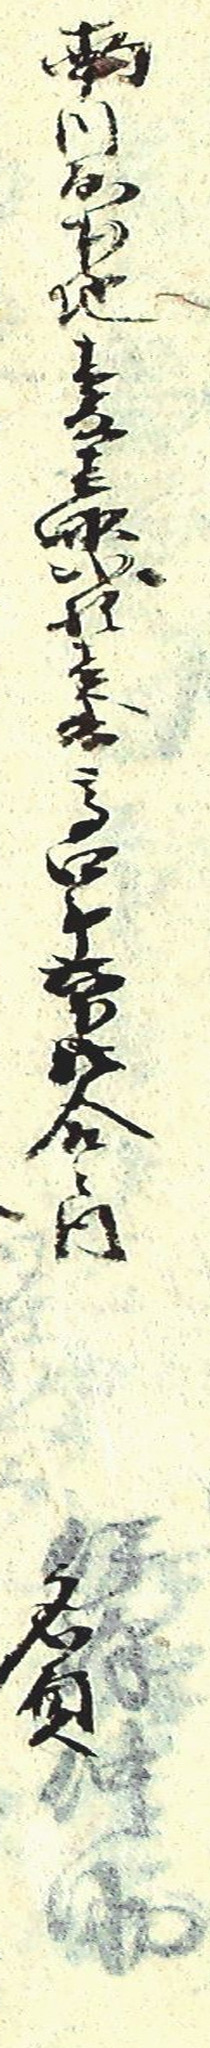南川原本地壱反壱畝弐拾壱歩高四斗六升八合之内
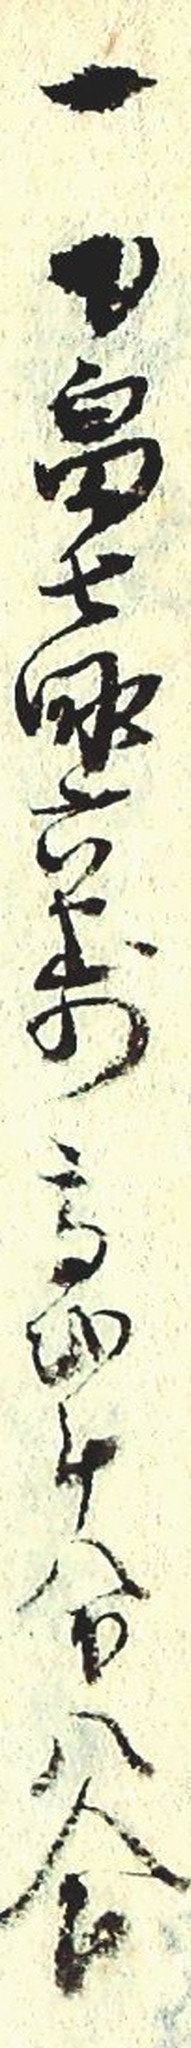一下畠七畝六歩高弐斗八升八合
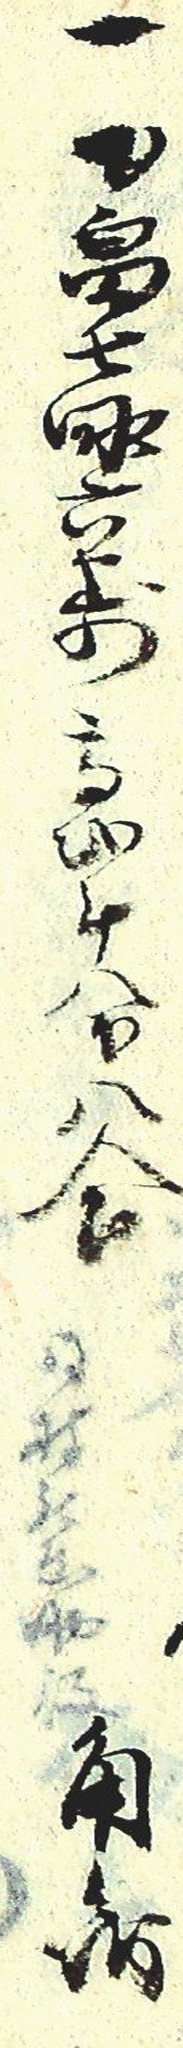一下畠七畝六歩高弐斗八升八合
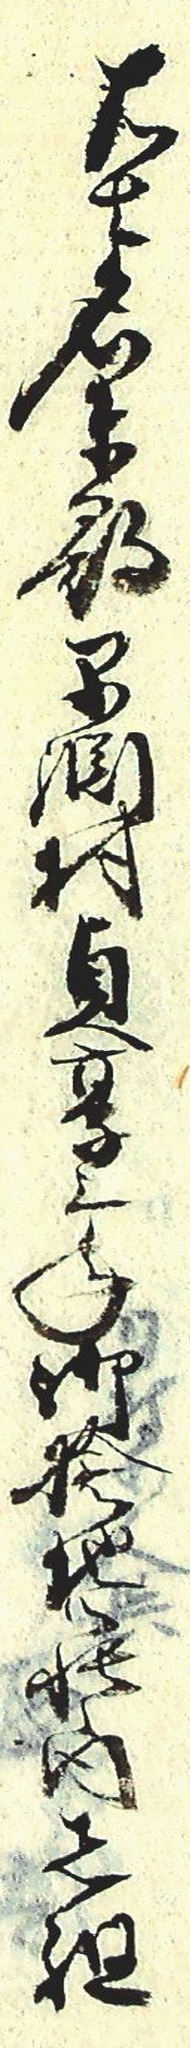右は名東郡早淵村貞享三年御検地御帳之内先祖
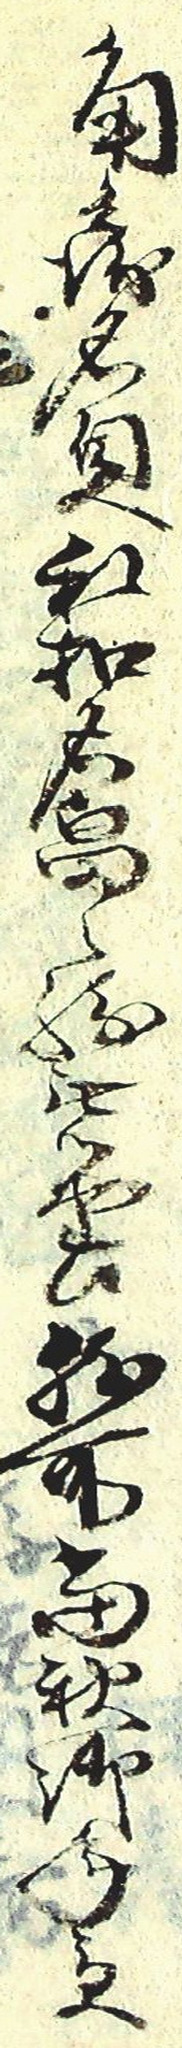角兵衛名負私扣名畠に紛無御座候然所当秋御年貢
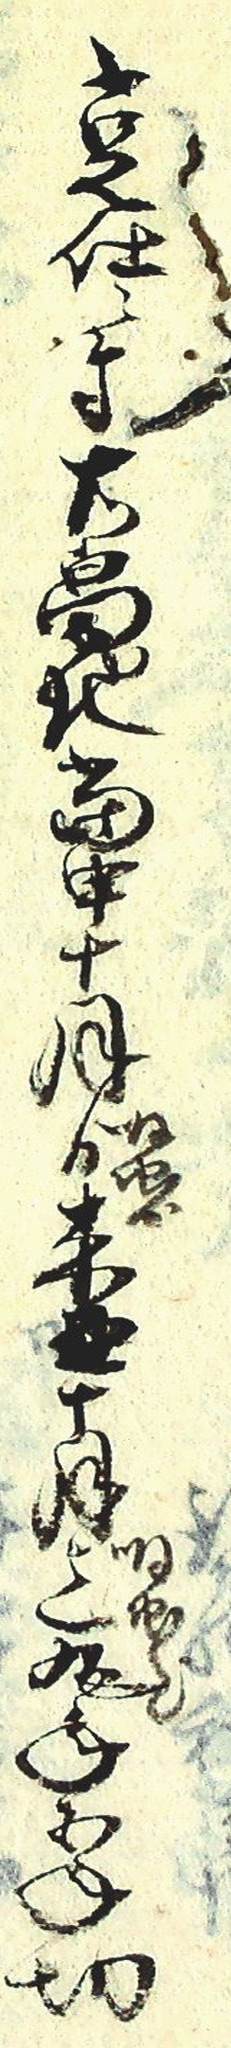不足仕に付右畠地当申十月ゟ来丑十月迄丸年五年切
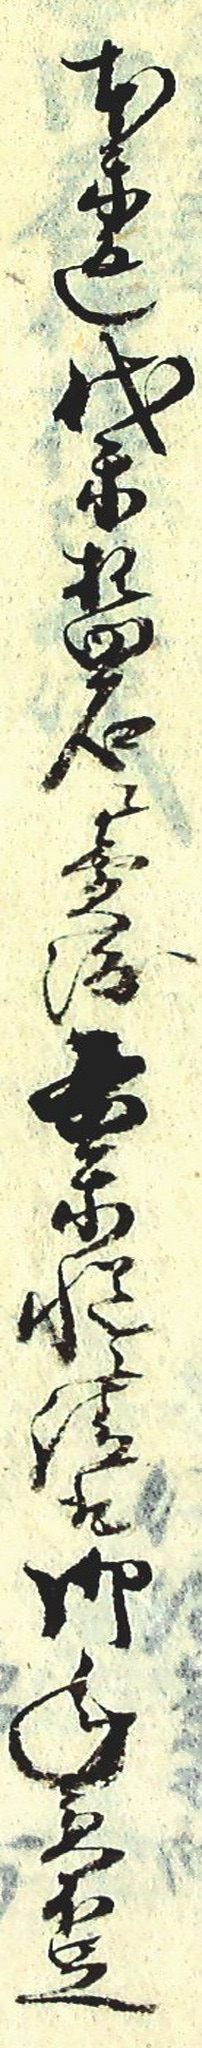本米返代米拾四石に売渡右米慥に請取御年貢不足
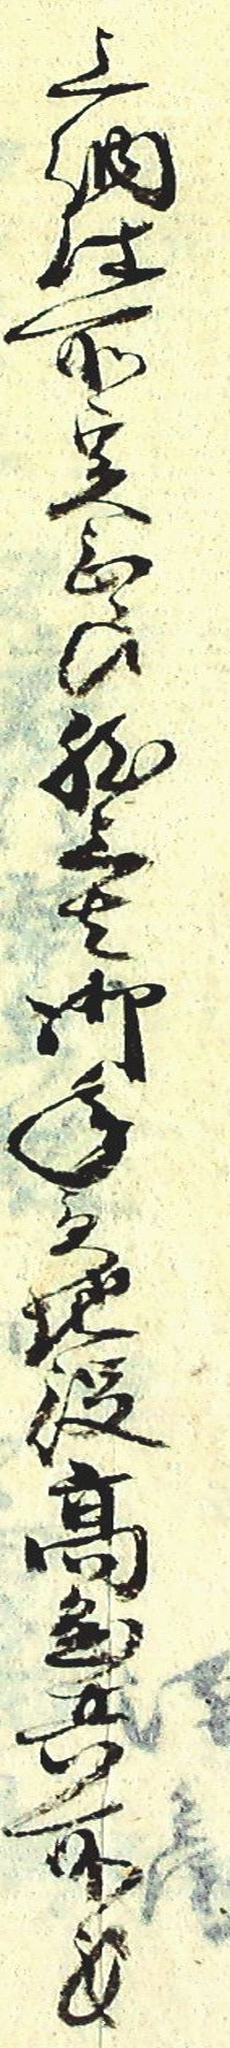上納仕所実正に候然上は御年貢地役高懸り共所之
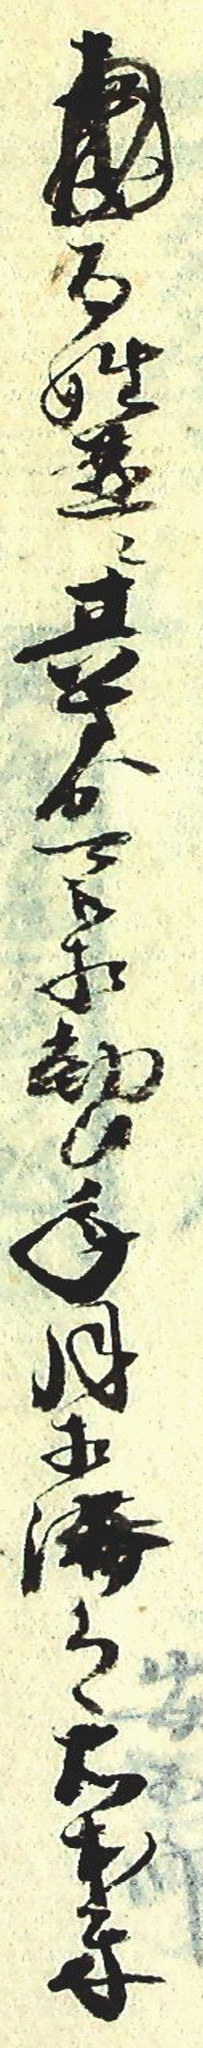百姓並に其方ゟ可被相勤候年月相済候はゝ右本米
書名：諸御願書控(弐番）
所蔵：鳴門教育大学 Naruto University of Education
